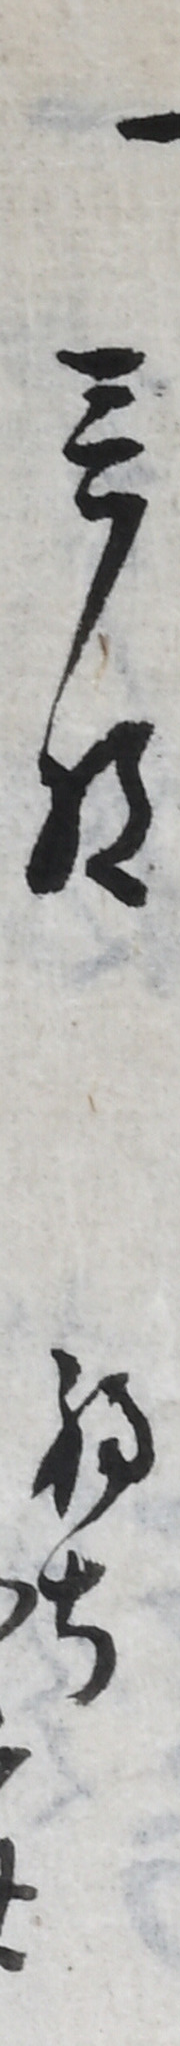一壱枚扇吉
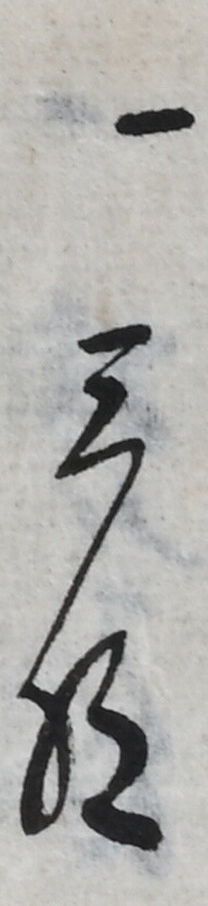一三枚
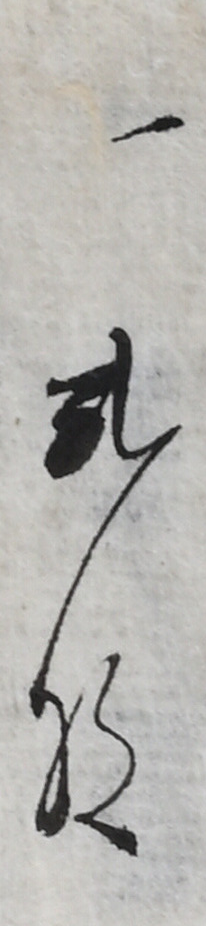一三枚
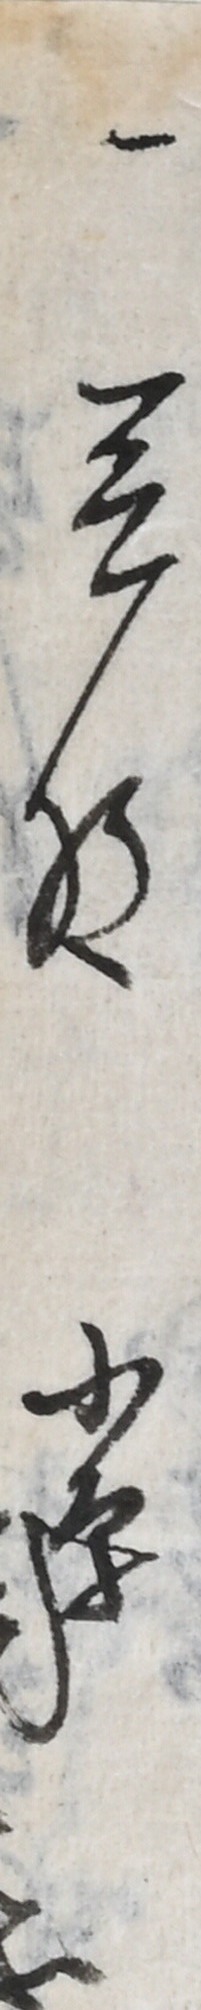一壱枚扇吉
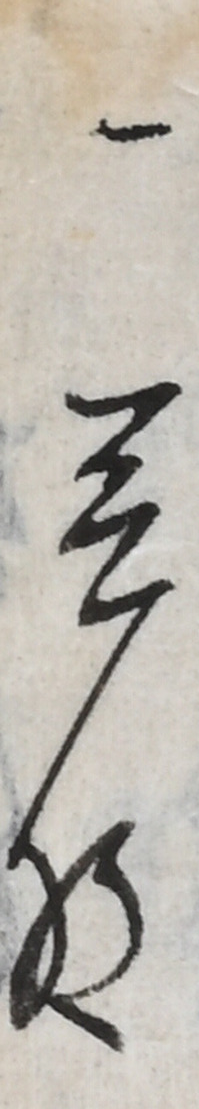一三枚
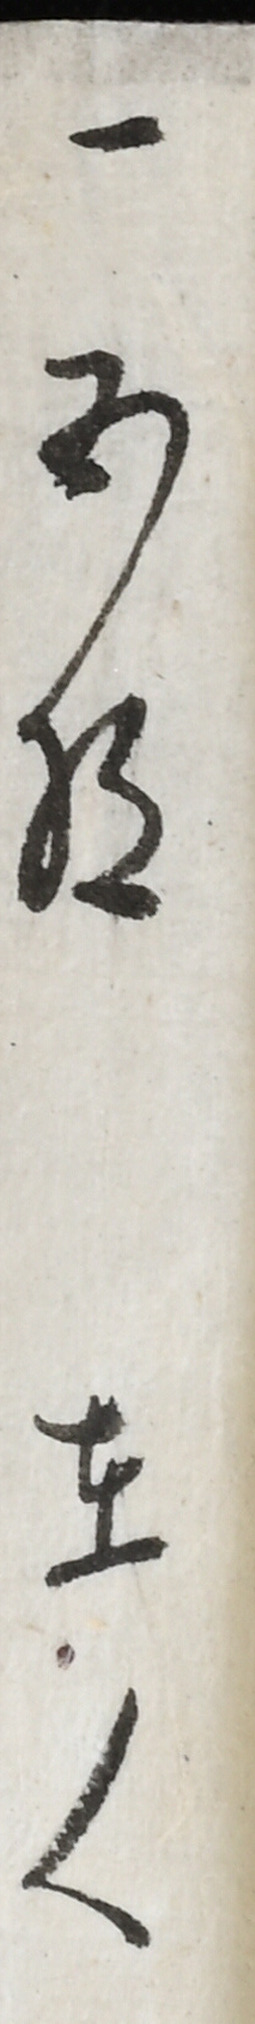一五枚在人
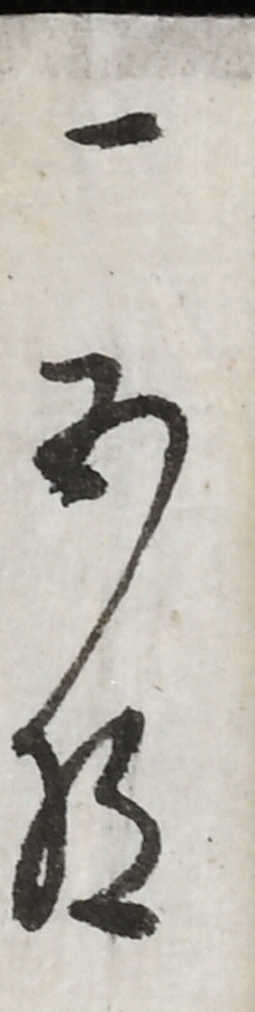一三枚
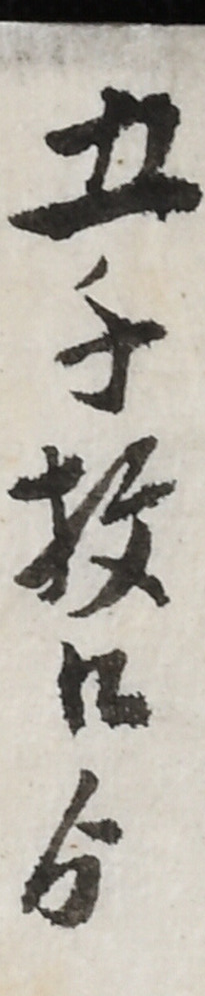五千枚口ゟ
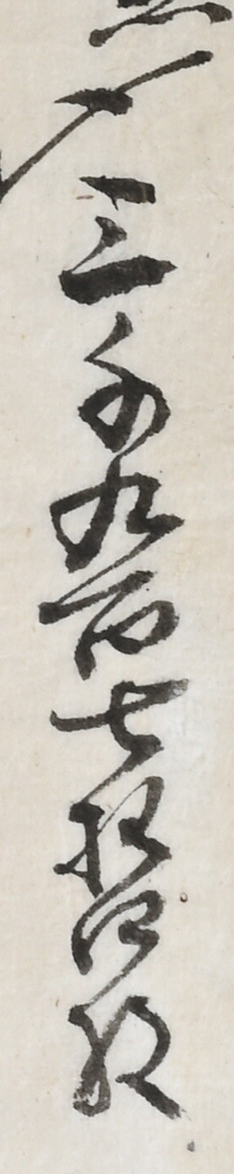惣〆三千九百七拾四枚
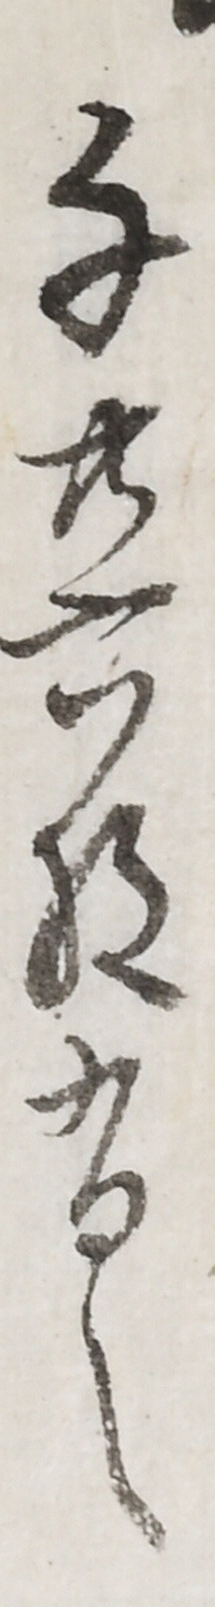千廿六枚有之
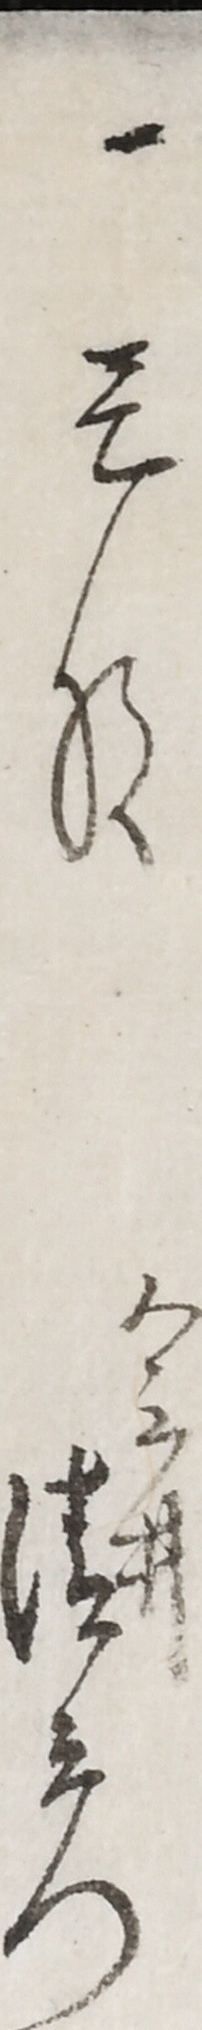一壱枚清右衛門
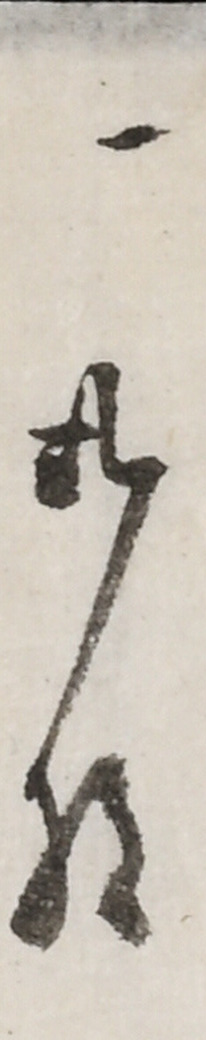一三枚
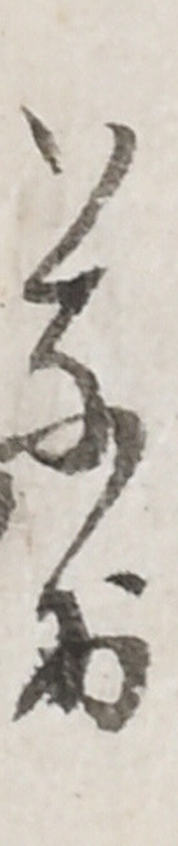御子柴
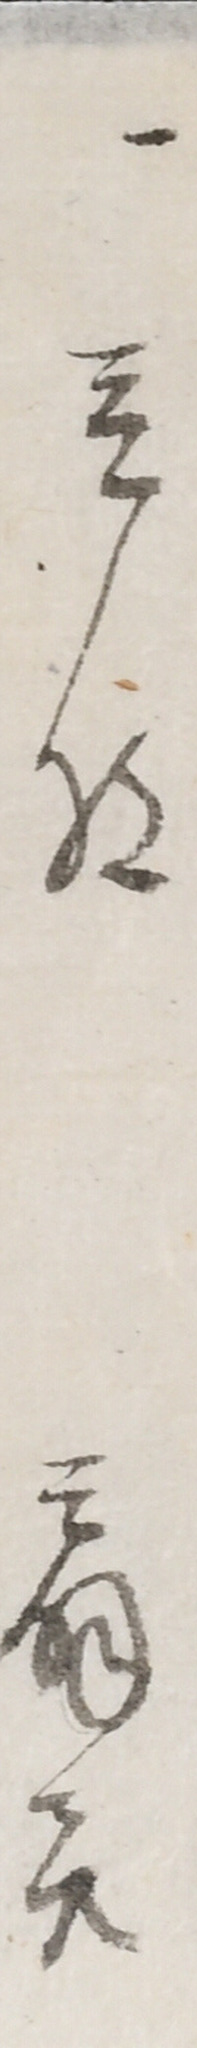一壱枚扇吉
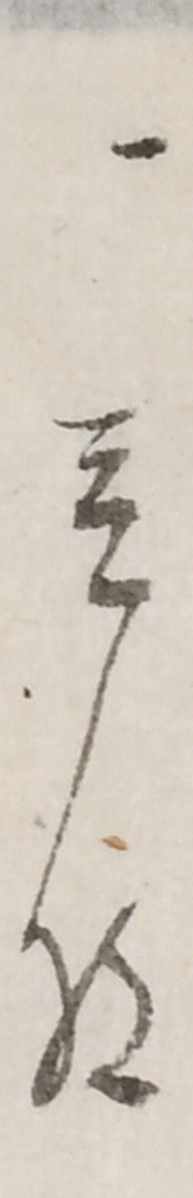一三枚
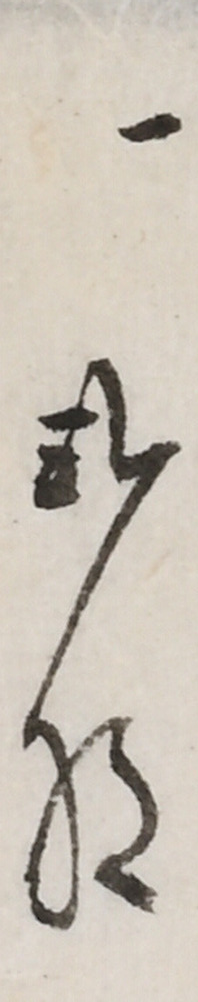一三枚
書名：髙遠限楮幣引換覚帳
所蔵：伊那市立高遠町図書館・合同会社AMANE
